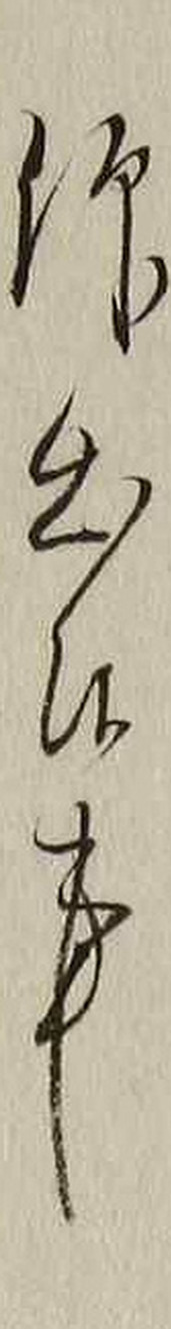仰出候事
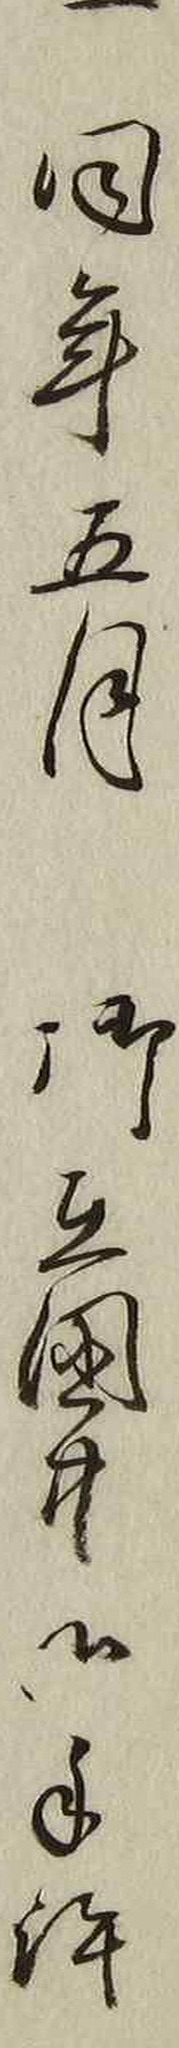一同年五月御在国中御手許
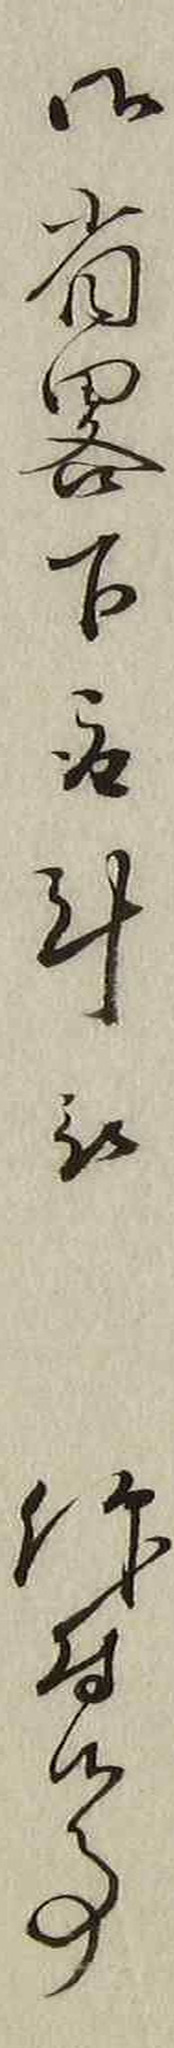御省略下取計被仰付候事
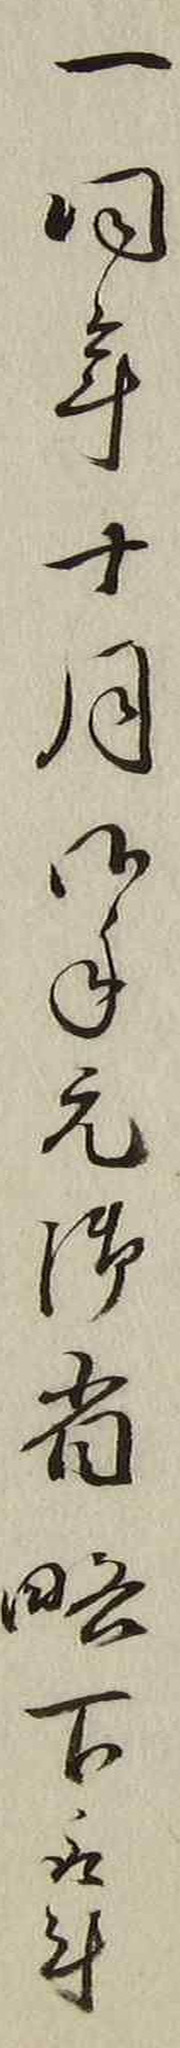一同年十月御手元御省略下取計
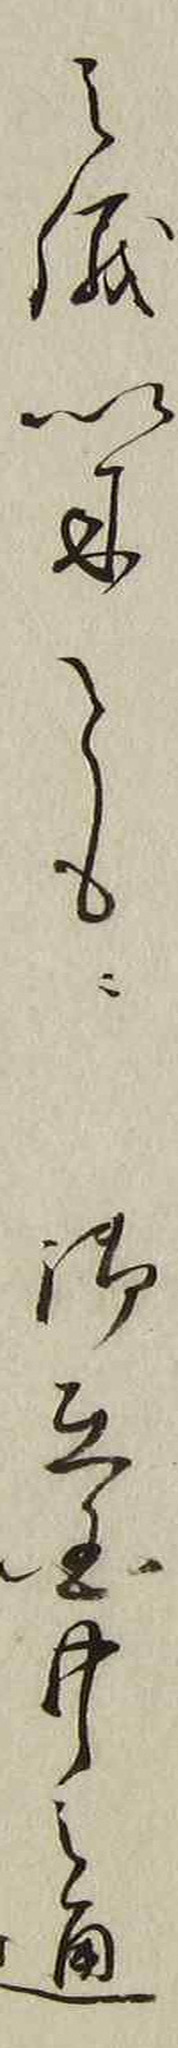之儀以来ともニ御在国中之通
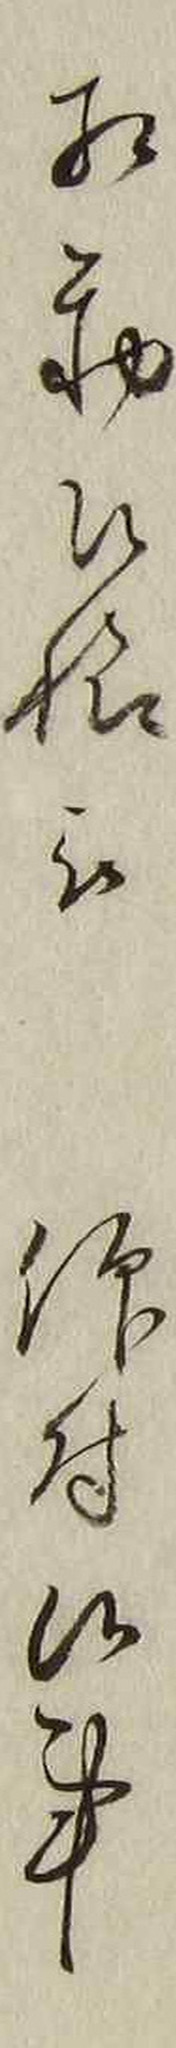相勤候様被仰付候事
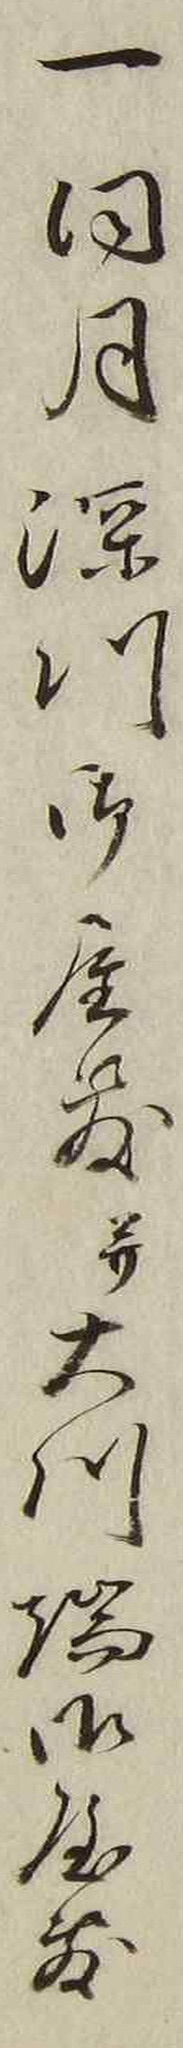一同月深川御屋敷并大川端御屋敷

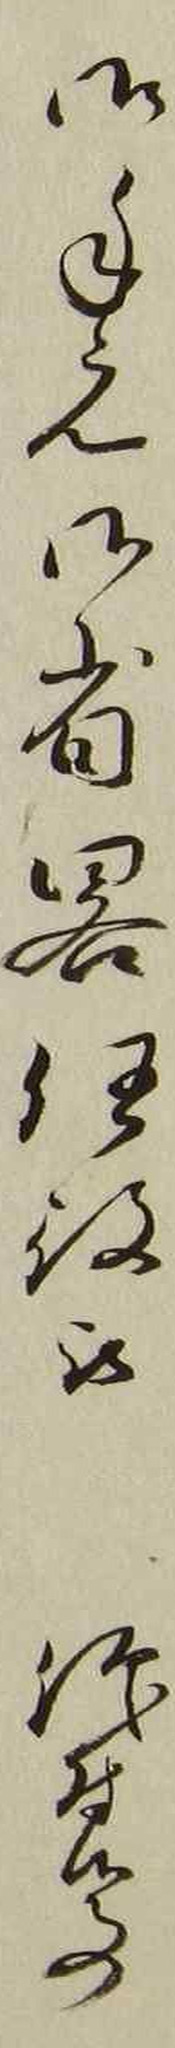御手元御省略任役被仰付候事
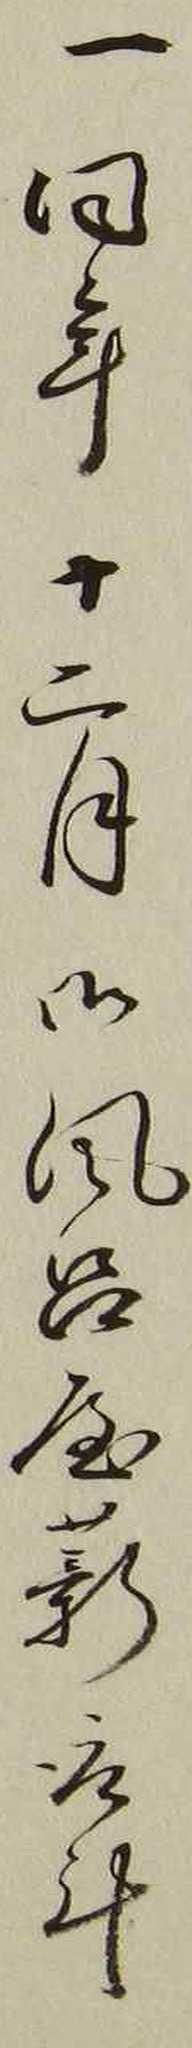一同年十二月御風呂屋薪取計
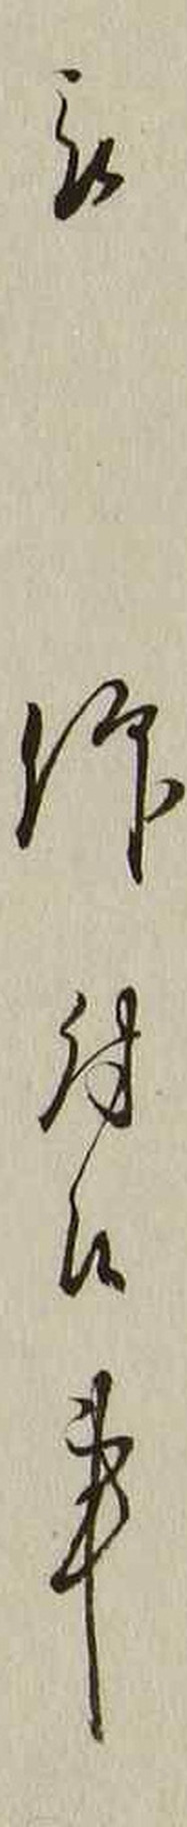被仰付候事
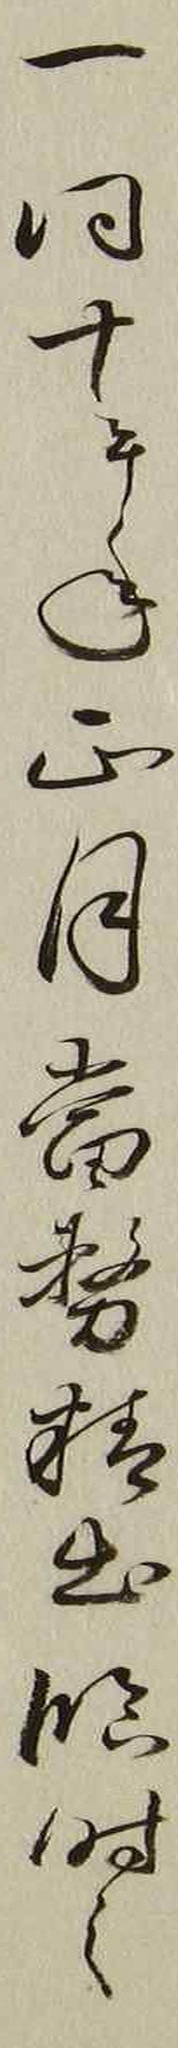一同十午年正月当務精出臨時之
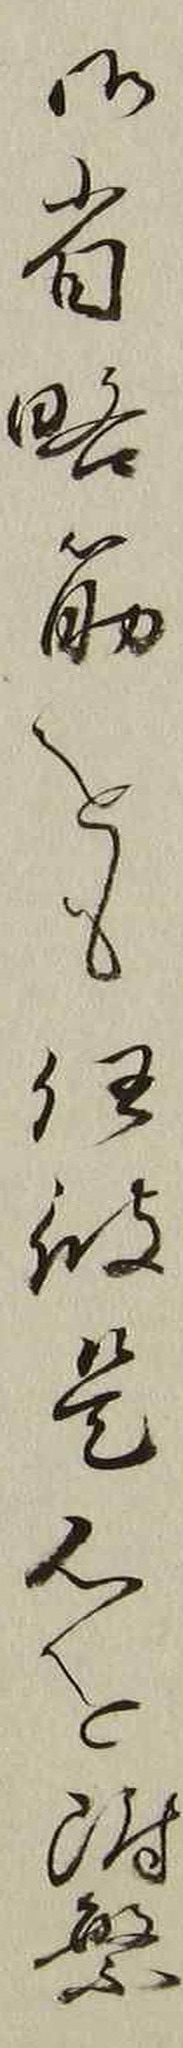御省略筋をも任彼是心を附繁
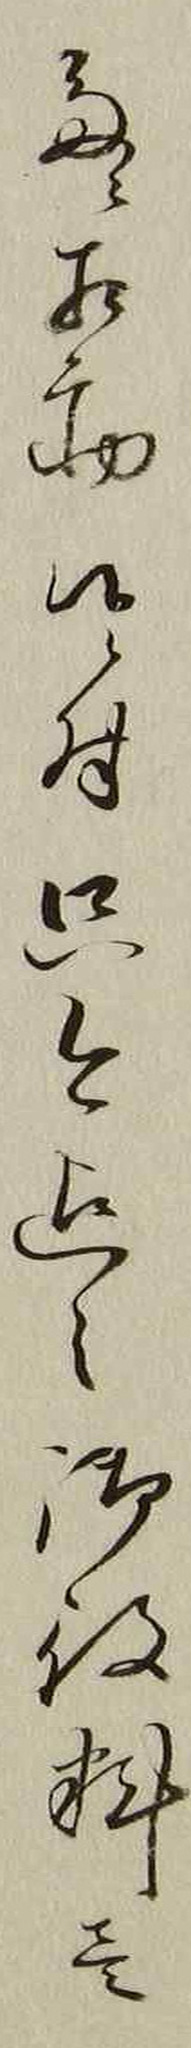多ニ相勤候ニ付只今迄之御役料壱
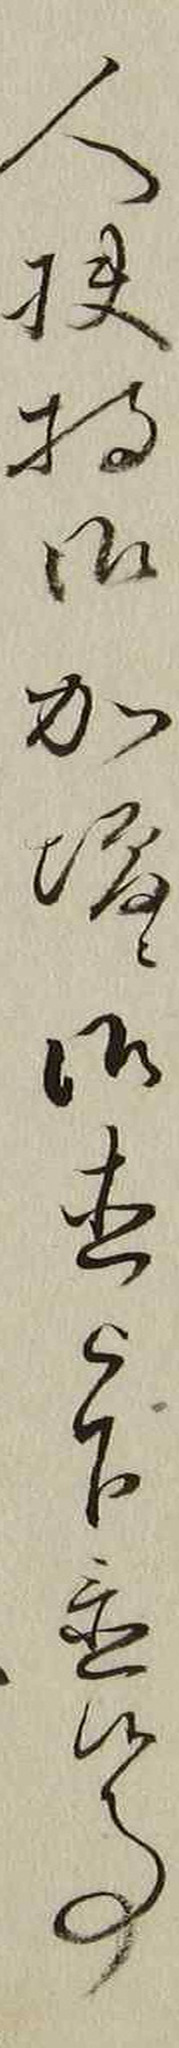人扶持御加増ニ御直被下置候事
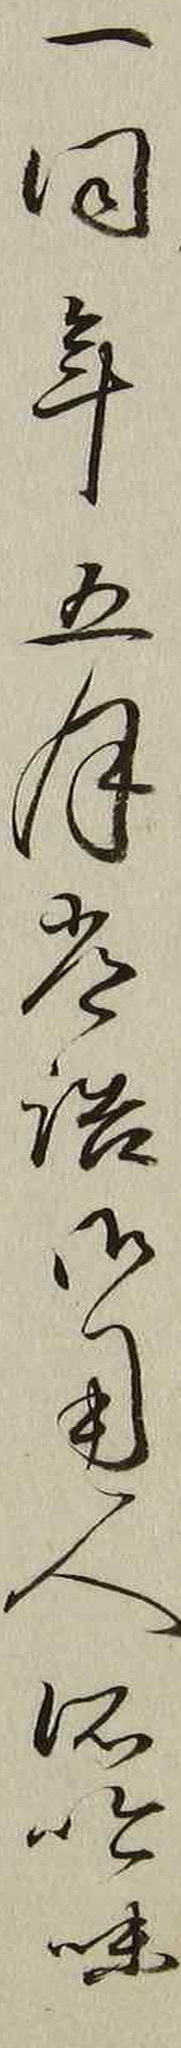一同年五月常詰御用人所吟味
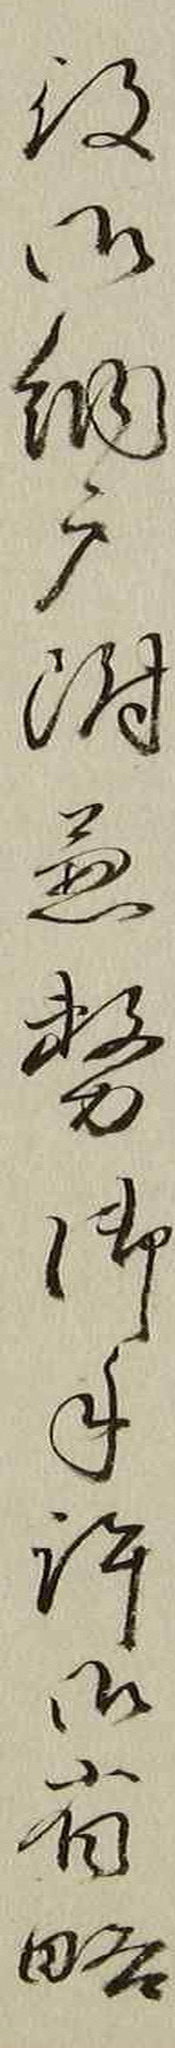役御納戸附兼務御手許御省略
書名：諸士系譜　巻之4　い之部4
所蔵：会津若松市立会津図書館
